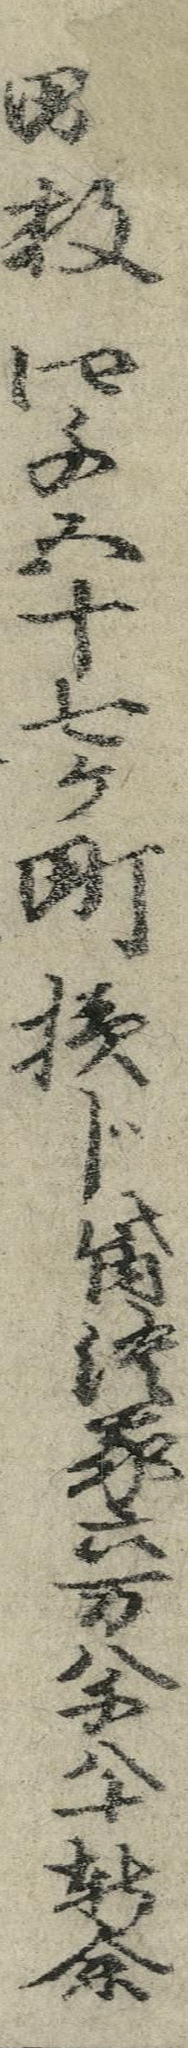町數四千五十七ヶ町損じ此内潰家六万八千八十軒余
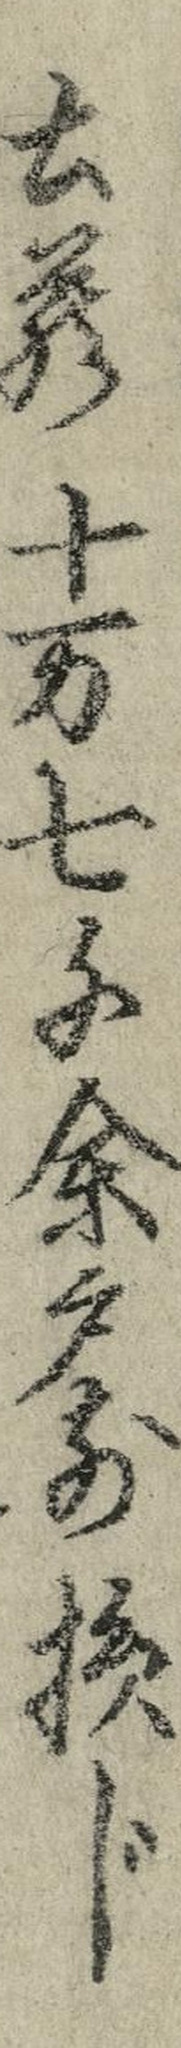土蔵十万七千余戸前損じ
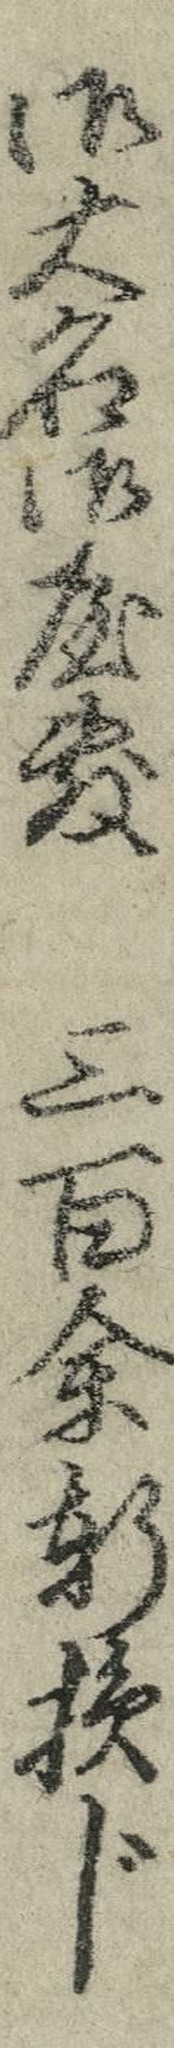御大名御屋敷三百余軒損じ
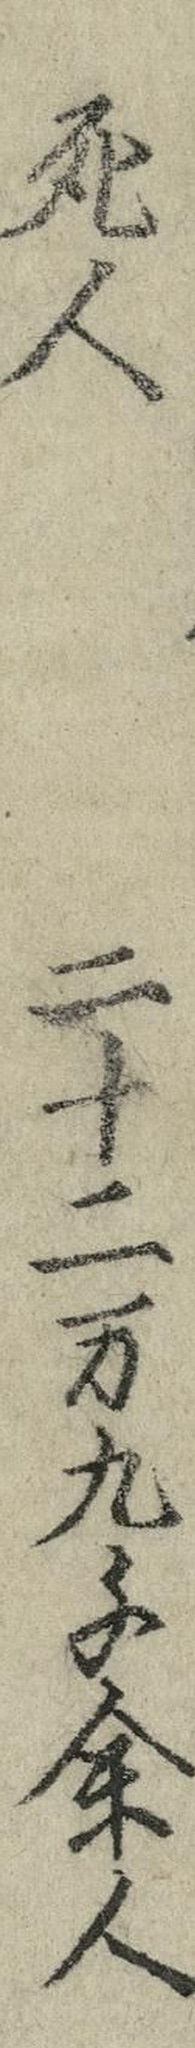死人二十二万九千余人
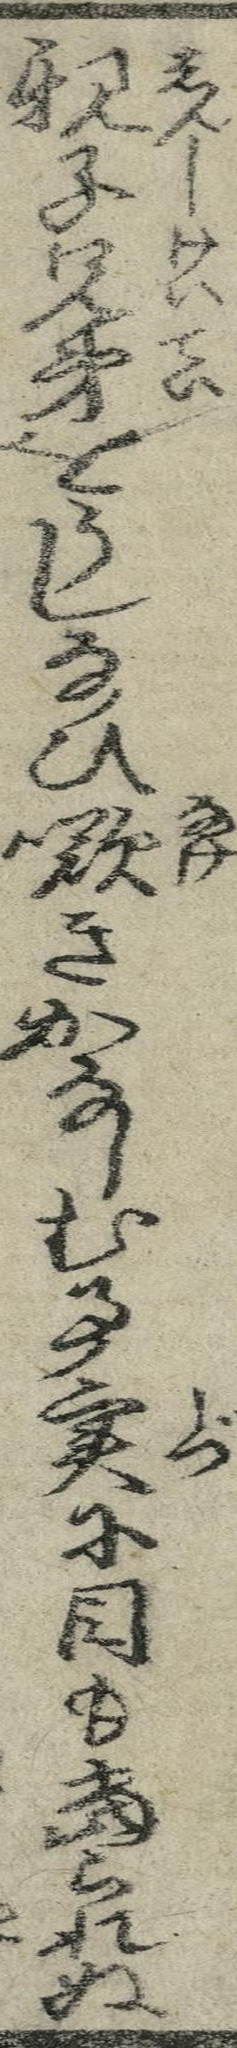親子兄弟をうしなひ歎きかなしむ事実に目も当られぬ
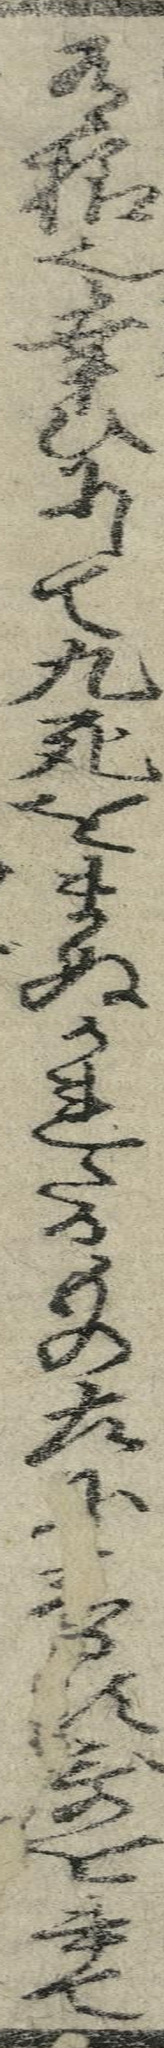有様也幸ひにして九死をまぬかれたるもの左にしるす歌を書て
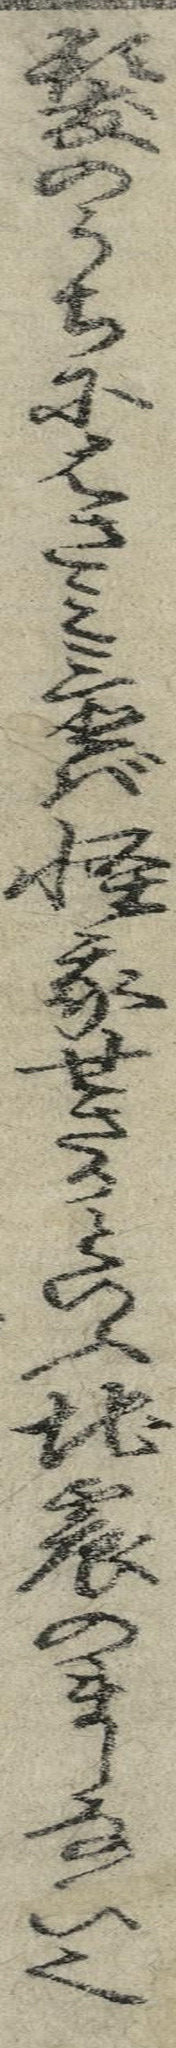髪のうちにはさみ置ば怪我せさりといふ地震のましなひ也
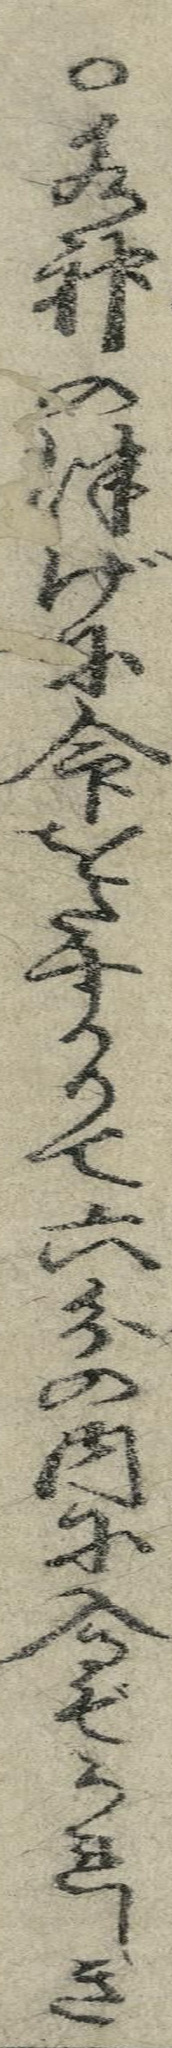○水神のつげに命をたすかりて六分の内に入るぞうれしき
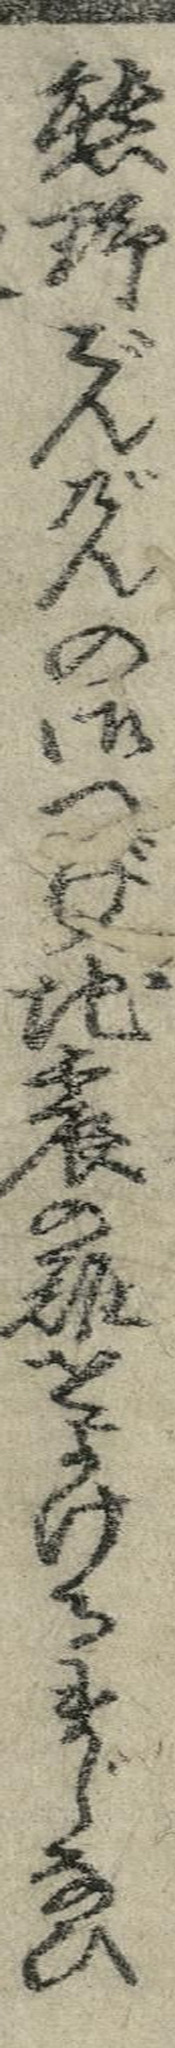熊野ごんげんの御つげ地震の難をよけるまじなひ
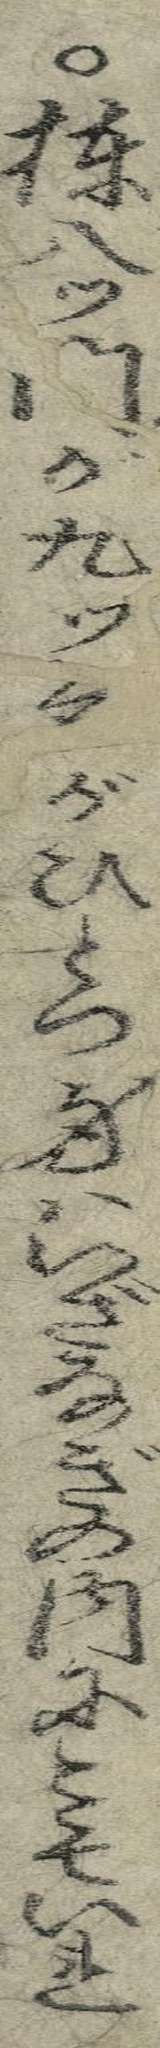○棟八つ門か九つ戸がひとつ身はいざなぎの内にとそいれ

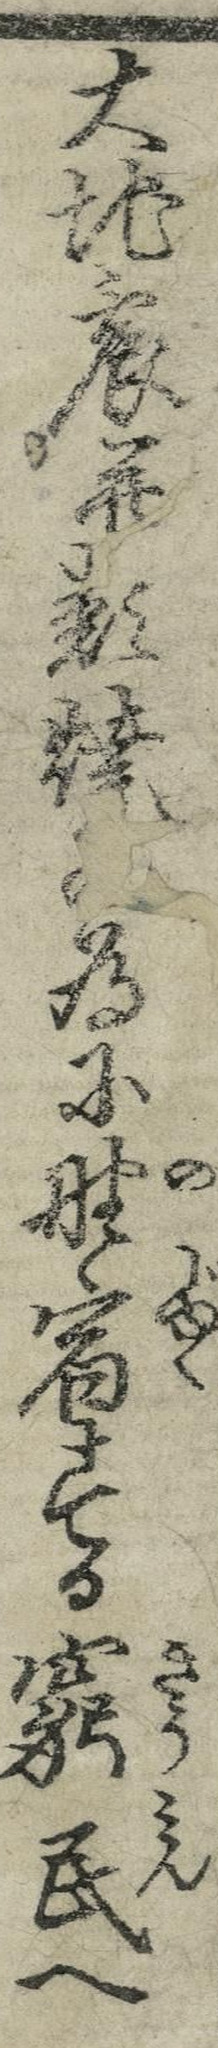大地震并類焼の為に野宿する窮民へ
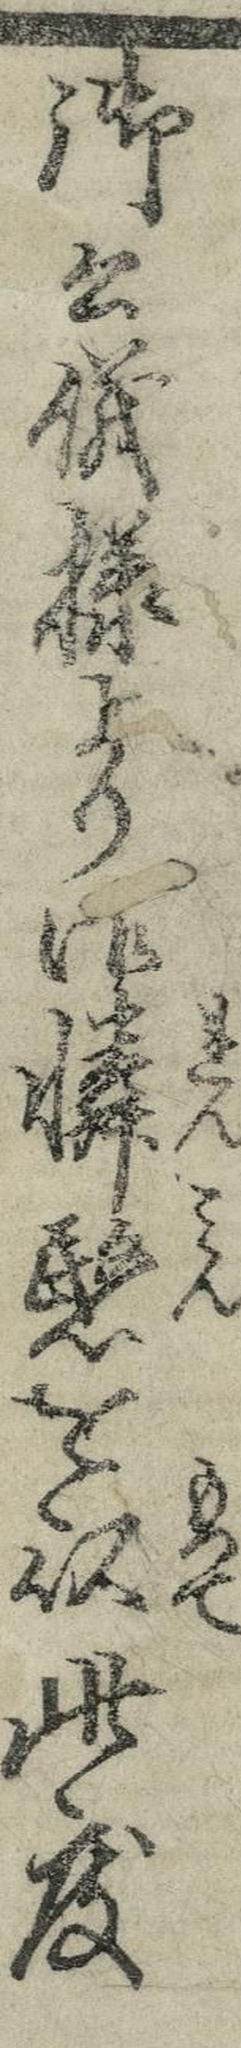御公儀様より御憐愍を以此度
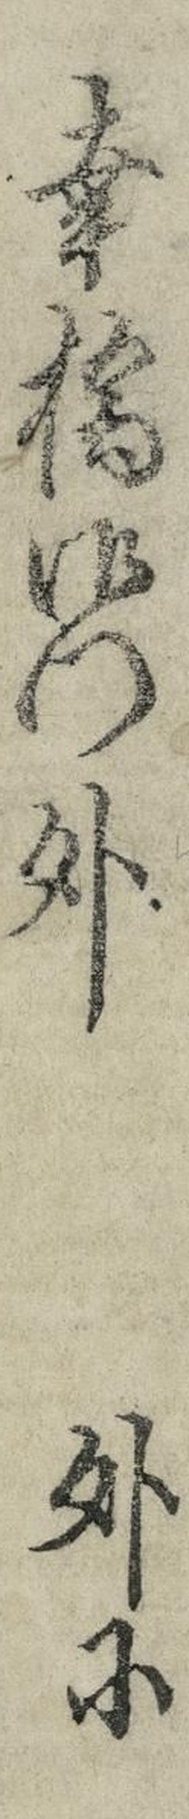幸橋御門外外に
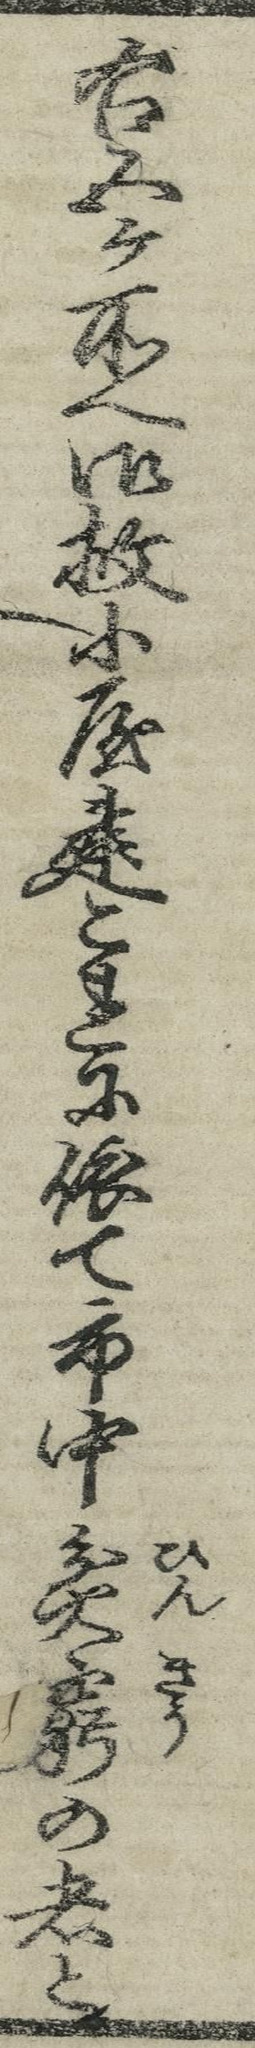右五ヶ所へ御救小屋建これに依て市中貧窮の者と
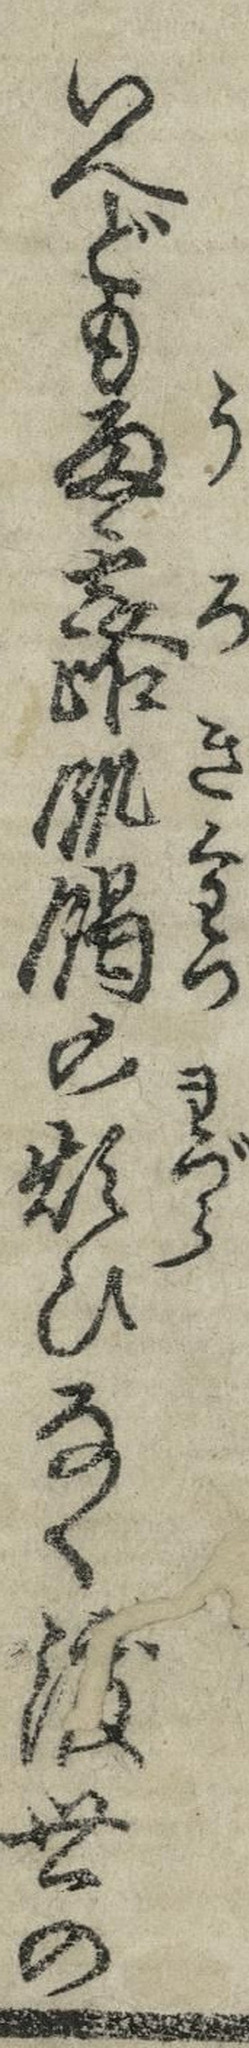いへども雨露飢渇の煩ひなく渡世の
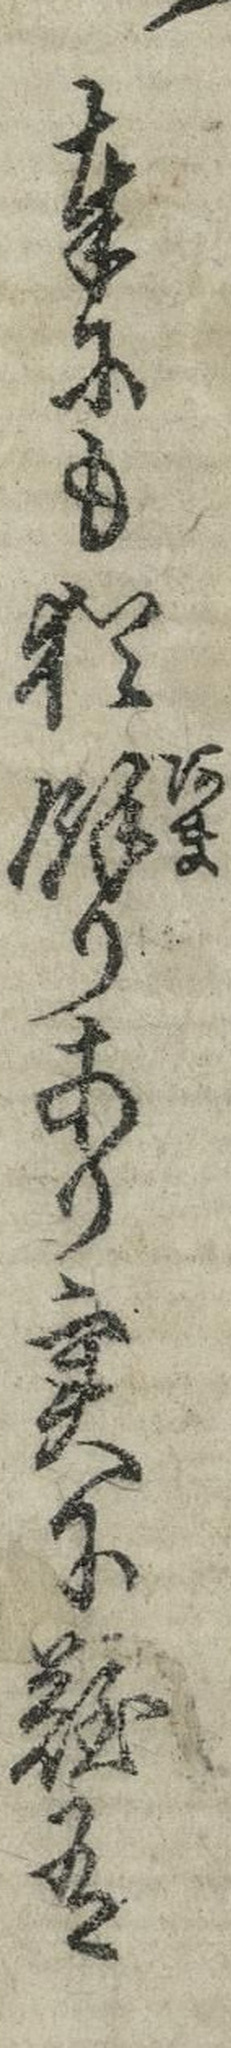奉にも猶余りあり実に難有
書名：江戸　大地震末代噺の種　全
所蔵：東京大学地震研究所図書室 Earthquake Research Institute Library, The University of Tokyo, JAPAN
